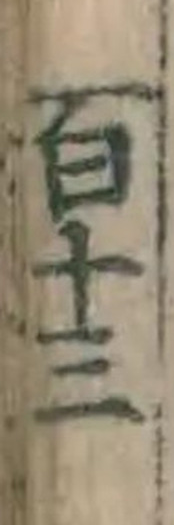百十三

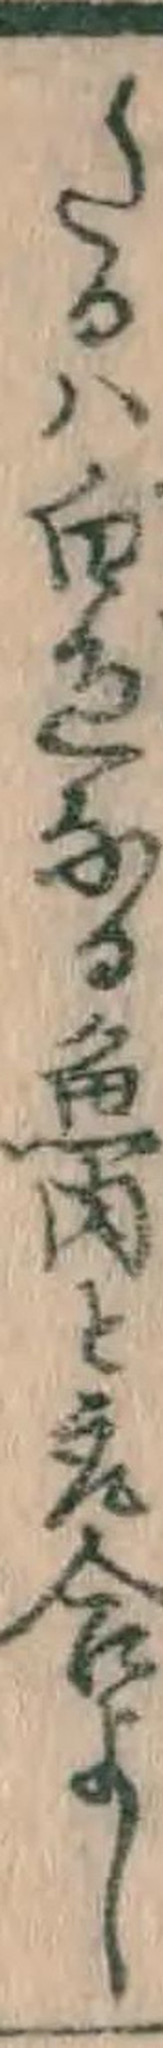たるは白色なる魚肉と取合よし
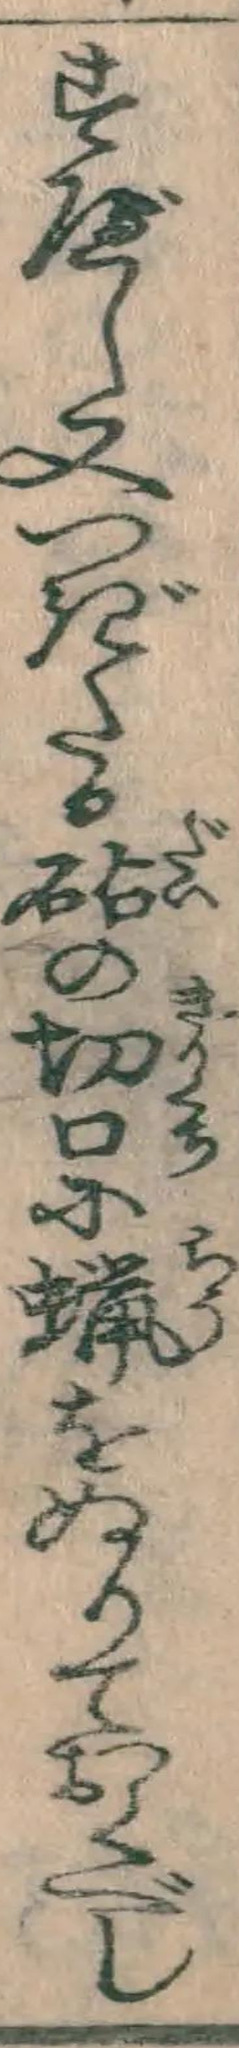すべし又つぎたる砧の切口に蠟をぬりておくべし
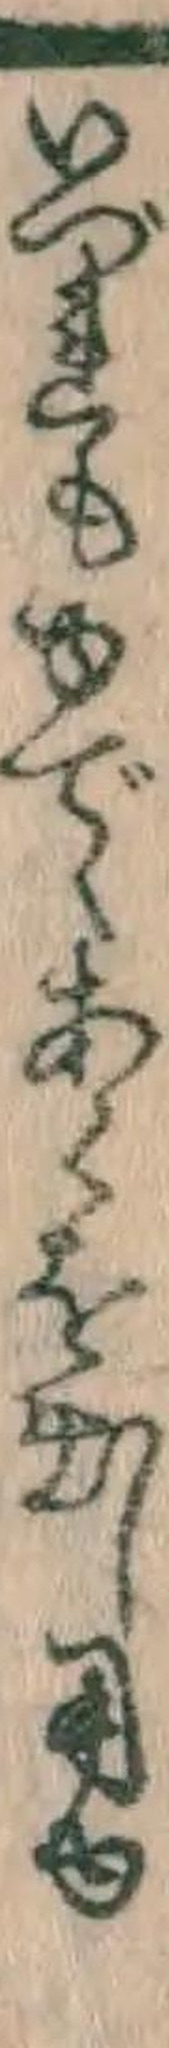いづれもゆでゝあくを出し用ゆ
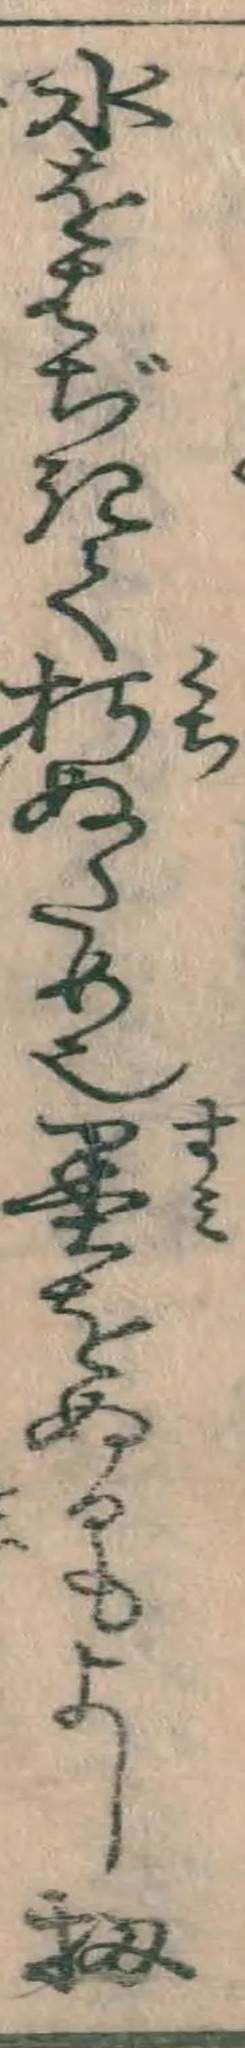水をはぢきて朽ぬため也墨をぬるもよし扨
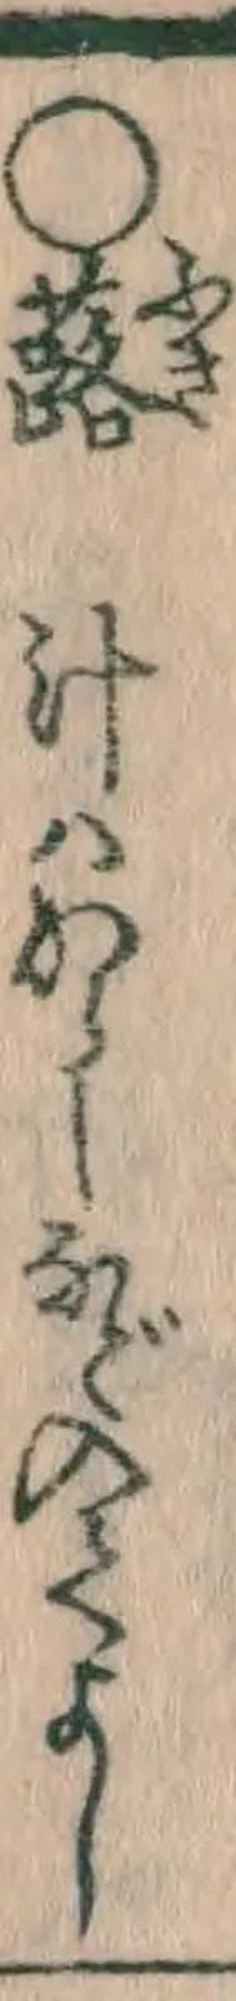○蕗汁はからしなど入てよし
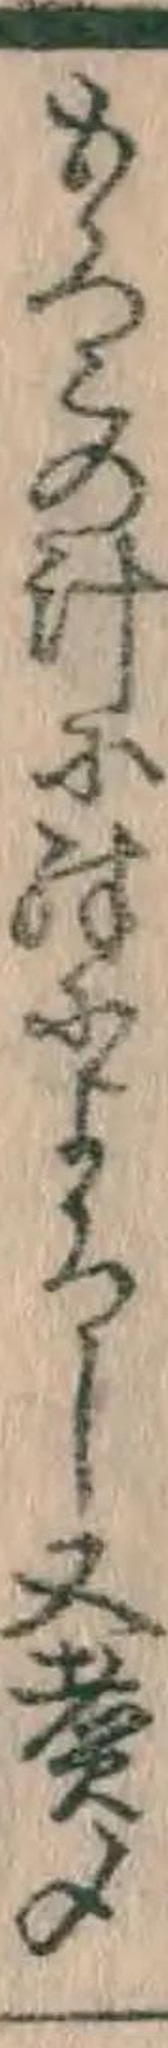もろこの汁に殊によろし又煮〆
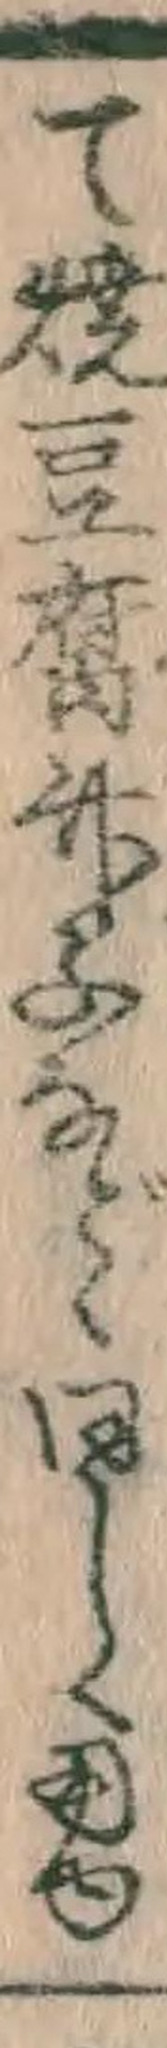て焼豆腐竹子などゝ同しく用ゆ
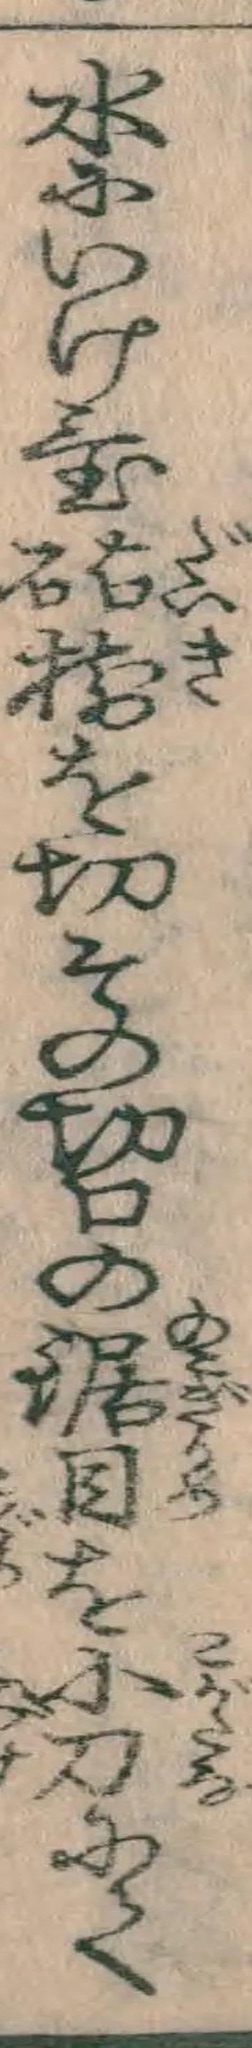水にいけ置砧樹を切その切口の鋸目を小刀にて
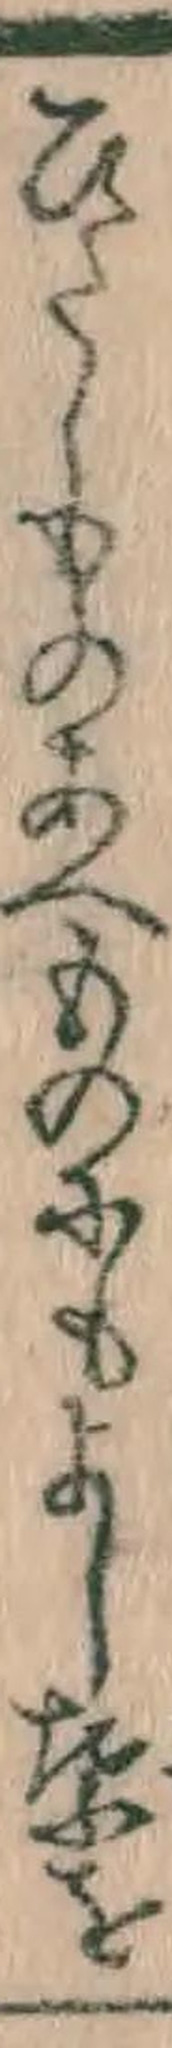ひたしものあへものにもよし葉を
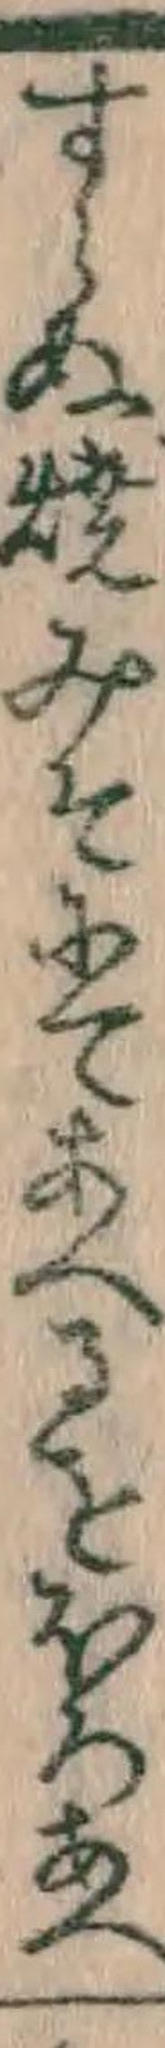すらぬ焼みそにてあへるをほろあへ
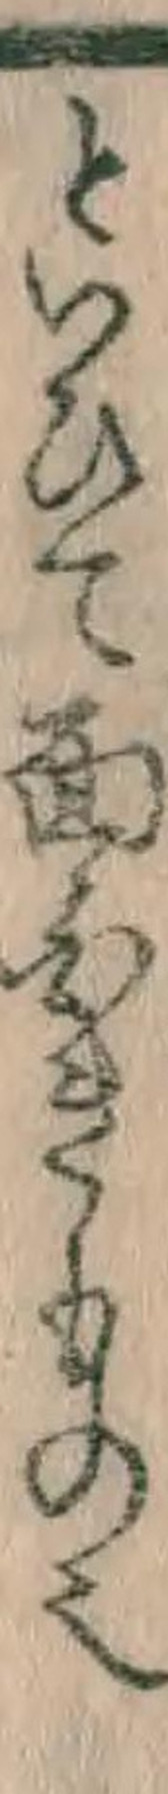といひて面白きもの也
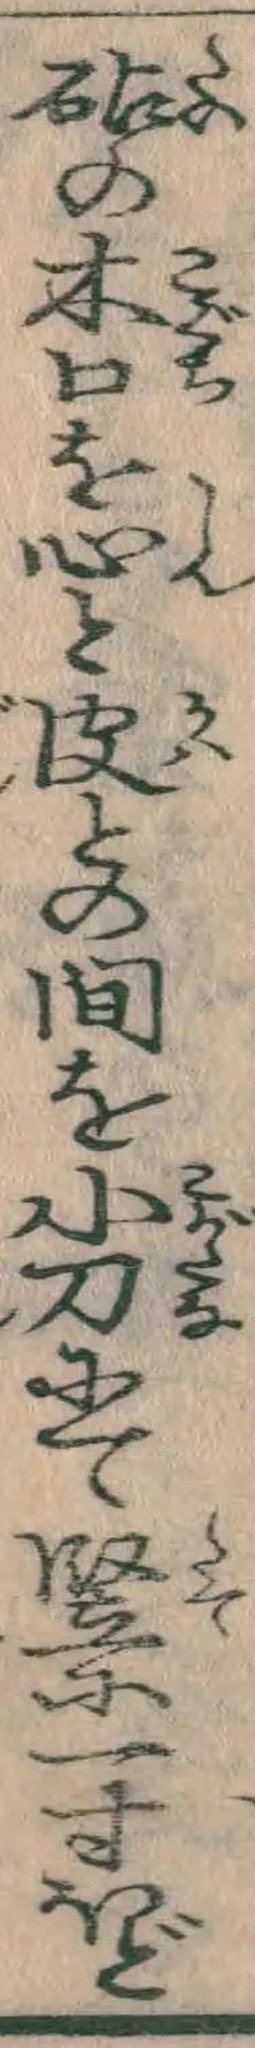砧の木口を心と皮との間を小刀にて竪に一寸ほど
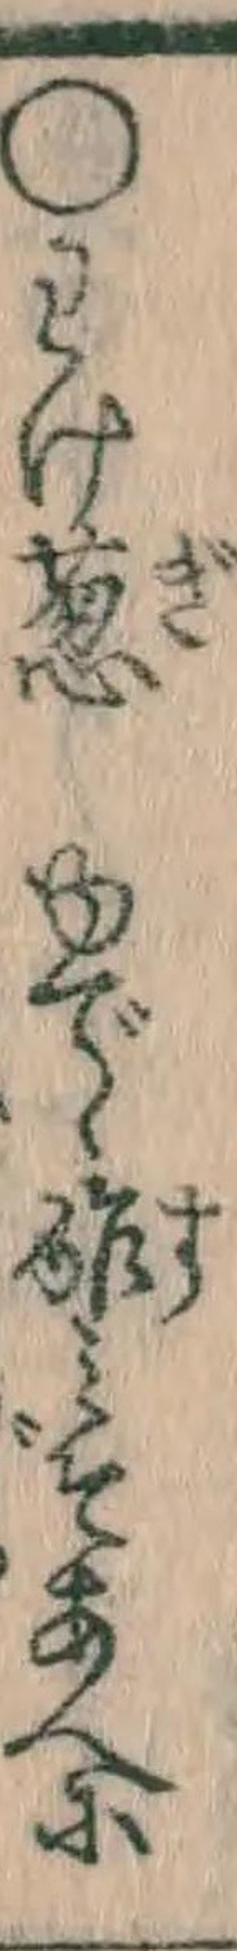○わけ葱ゆでゝ酢みそあへに
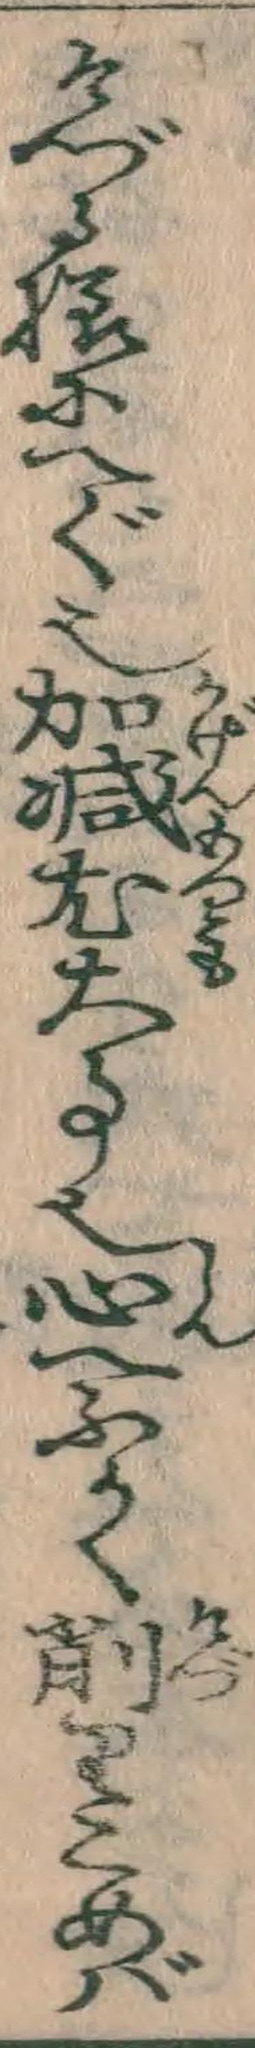けづる様にへぐ也加減尤大事也心へふかく削りこめば
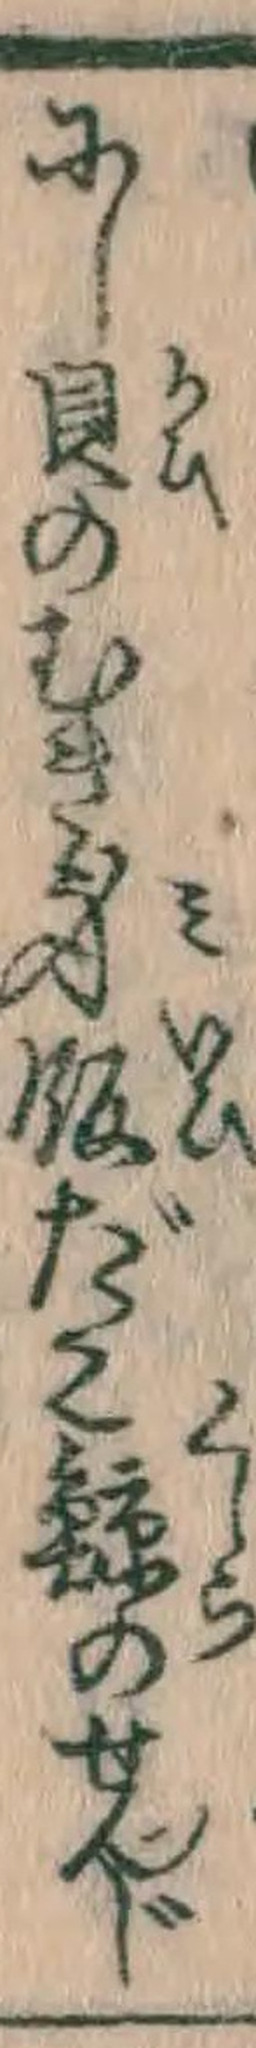にし貝のむき身飯だこ鯨のせんじ
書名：広益秘事大全 3巻. [5]
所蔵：国立国会図書館 National Diet Library, JAPAN
